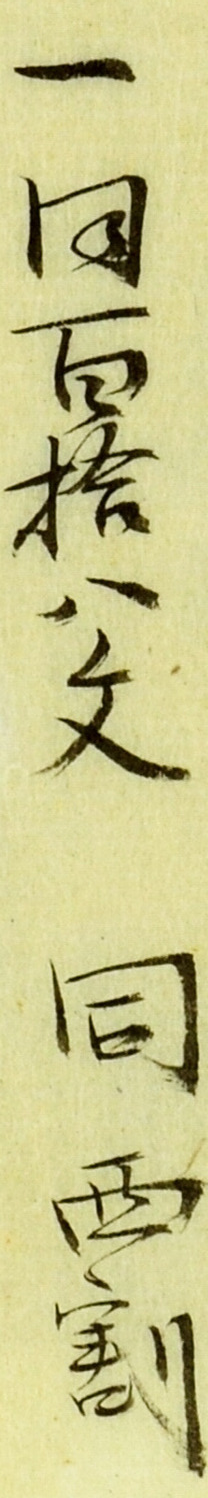一同百拾八文同西割
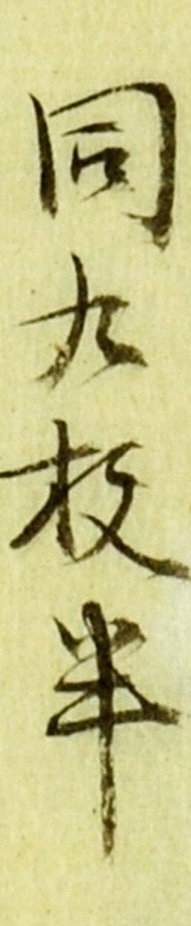同九枚半
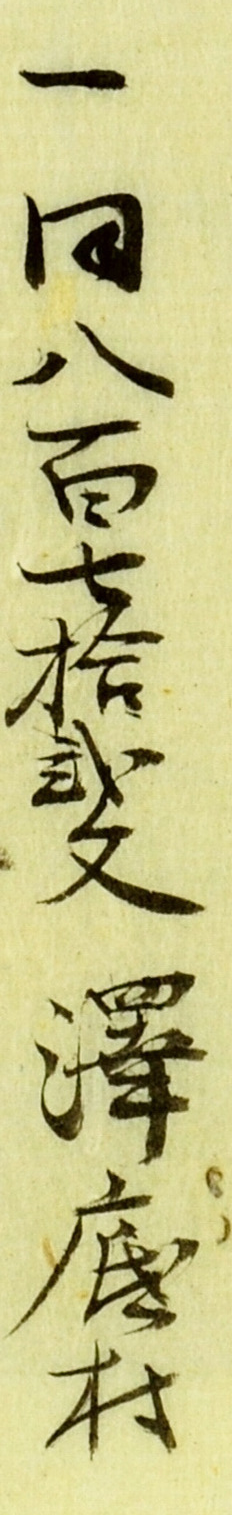一同八百七拾弐文沢底村
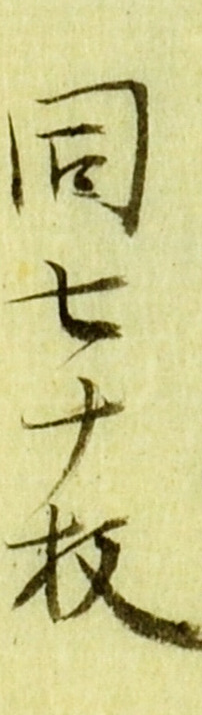同七十枚
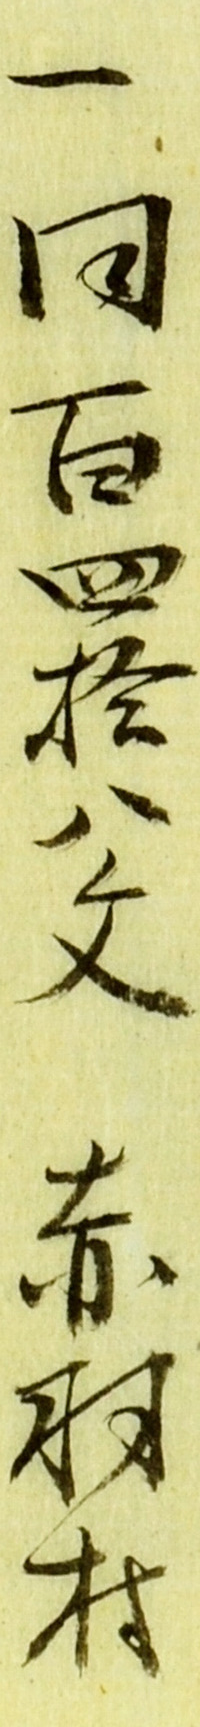一同百四拾八文赤羽村
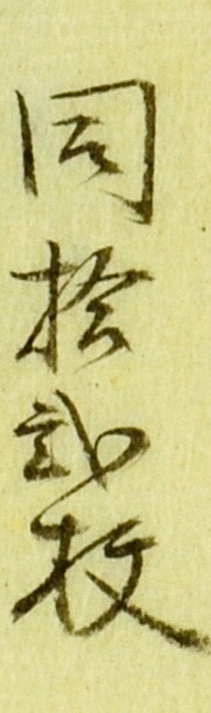同拾弐枚
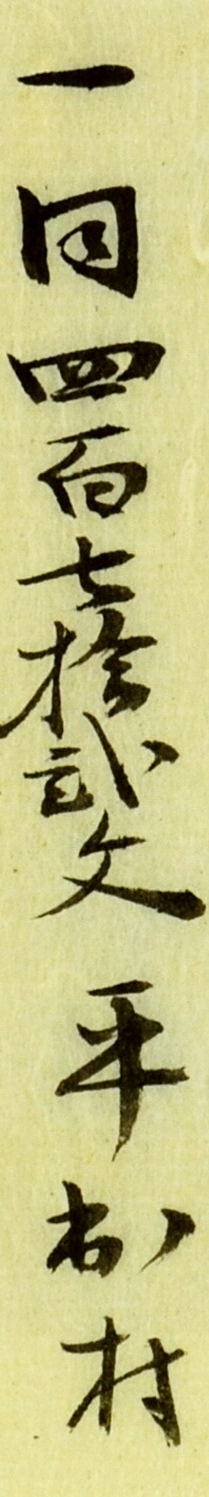一同四百七拾弐文平出村
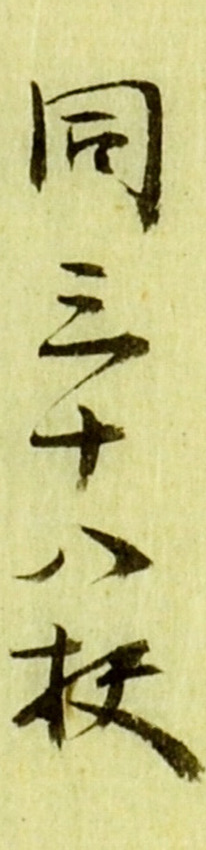同三十八枚
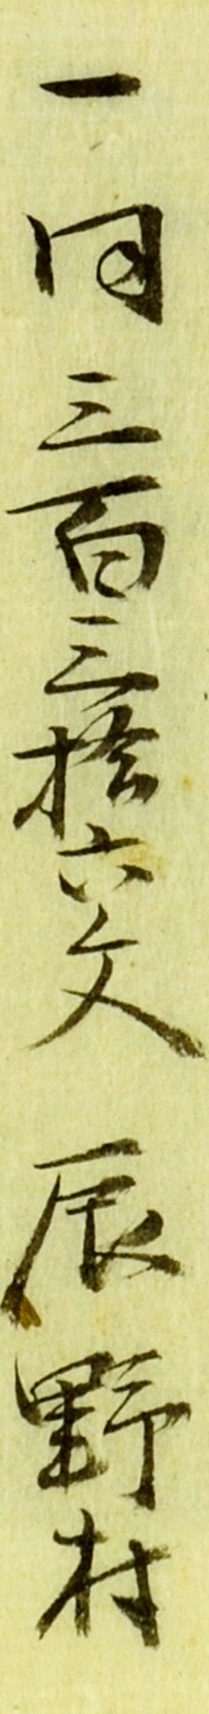一同三百三拾六文辰野村
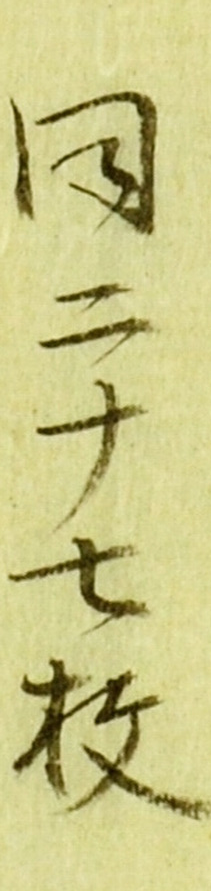同二十七枚
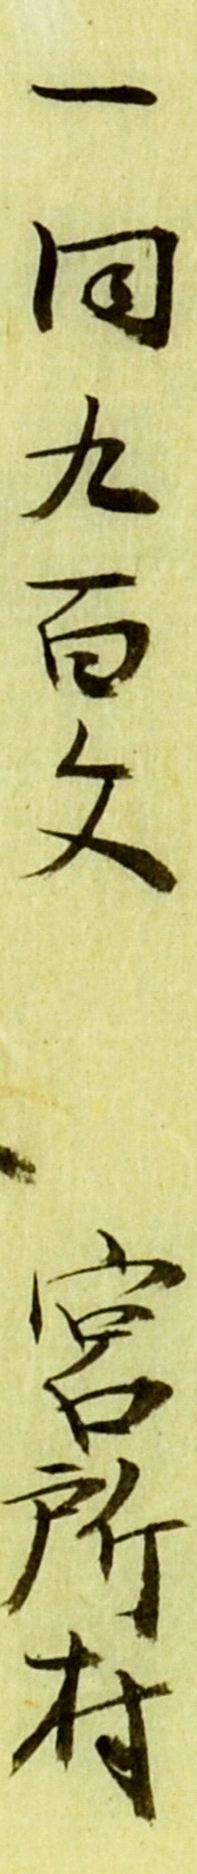一同九百文宮所村
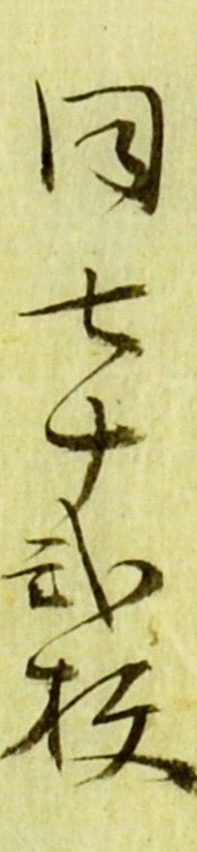同七十弐枚
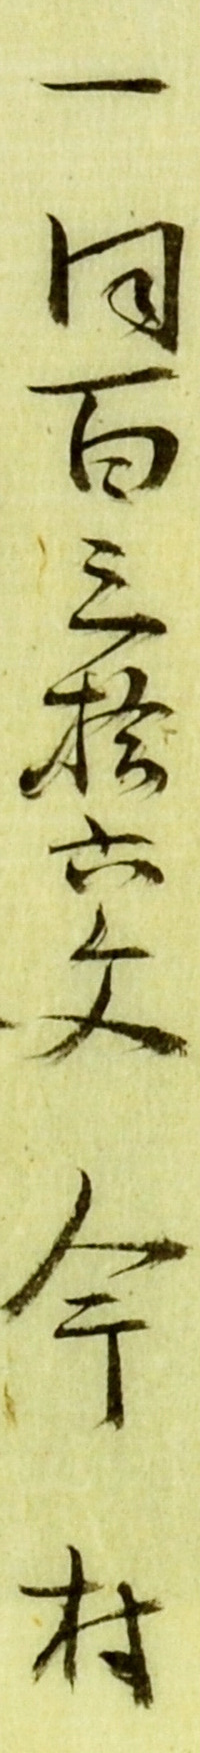一同百三拾六文今村
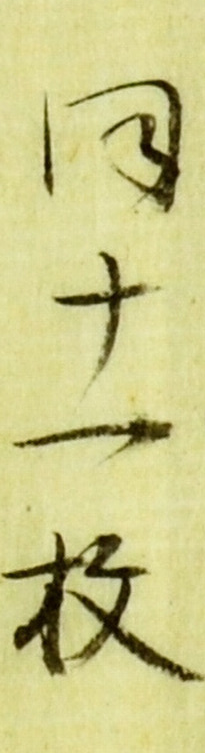同十一枚
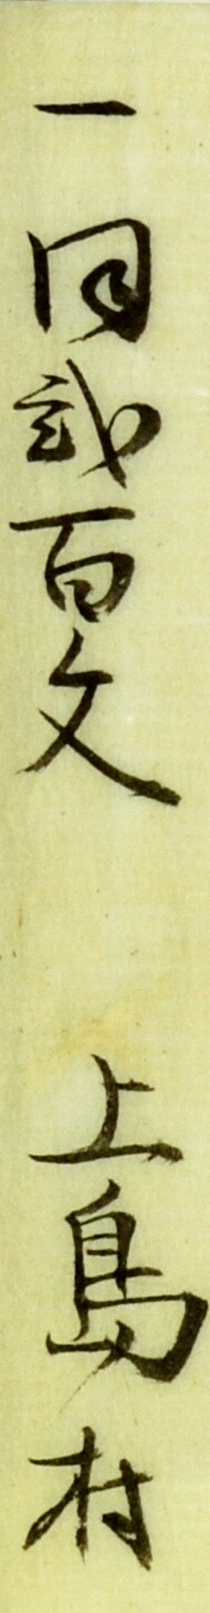一同九百文宮所村
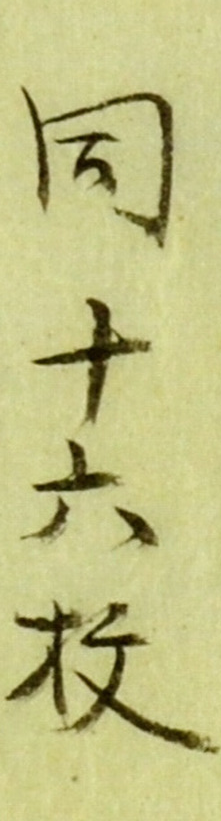同十一枚
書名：上伊那郷諸運上取調帳
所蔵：伊那市立高遠町図書館・合同会社AMANE
